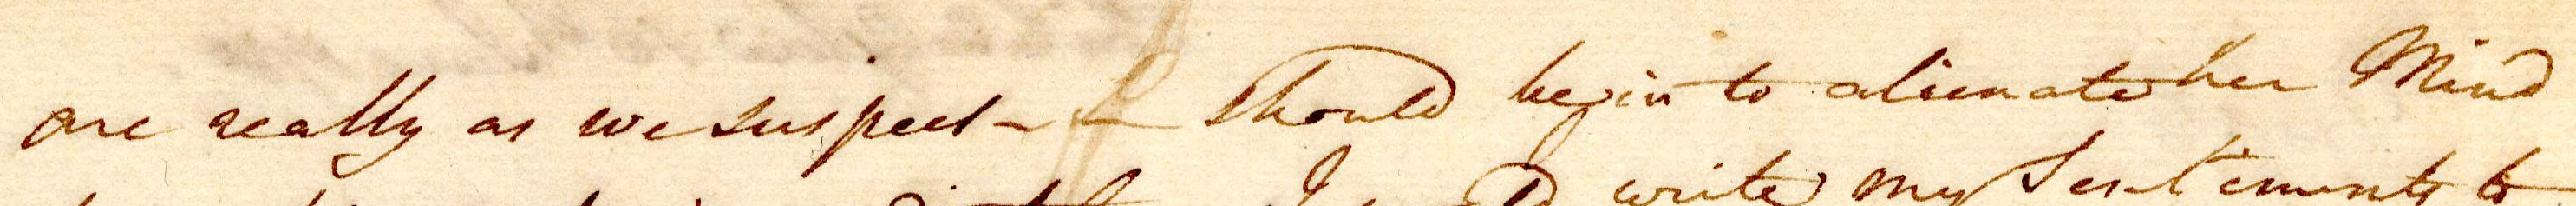are really as we suspect- should begin to alienate her Mind
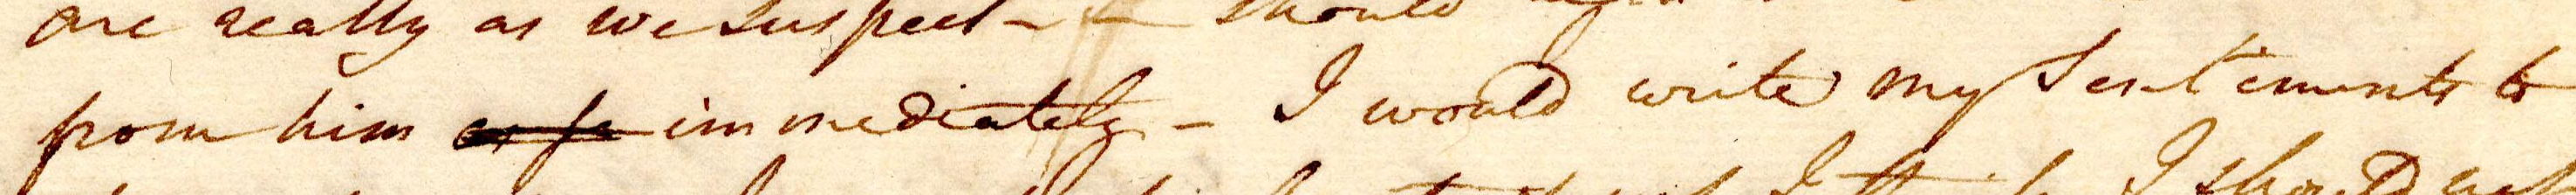from him [or fe] immediately. I would write my Sentiments &
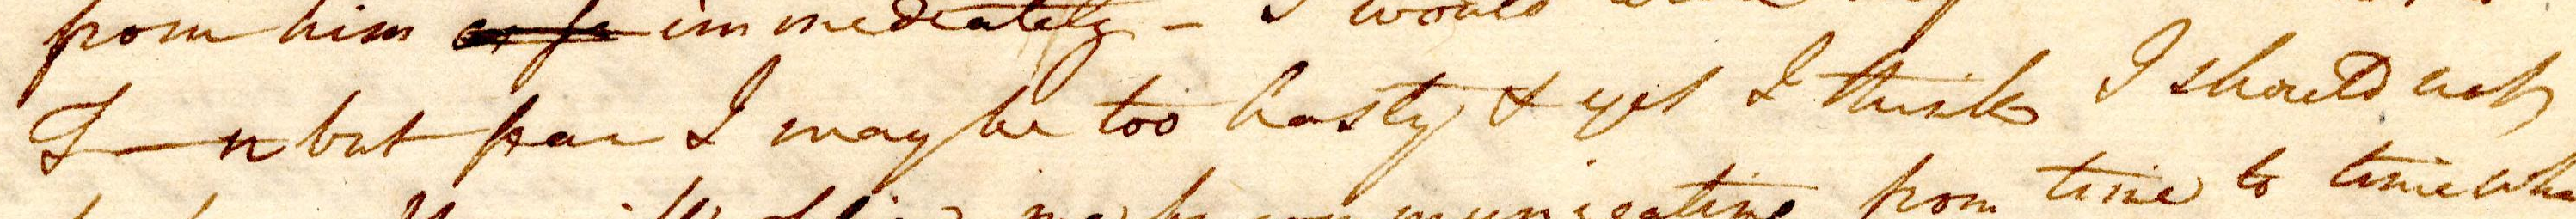T-n but for I may be too hasty & yet I think I should not
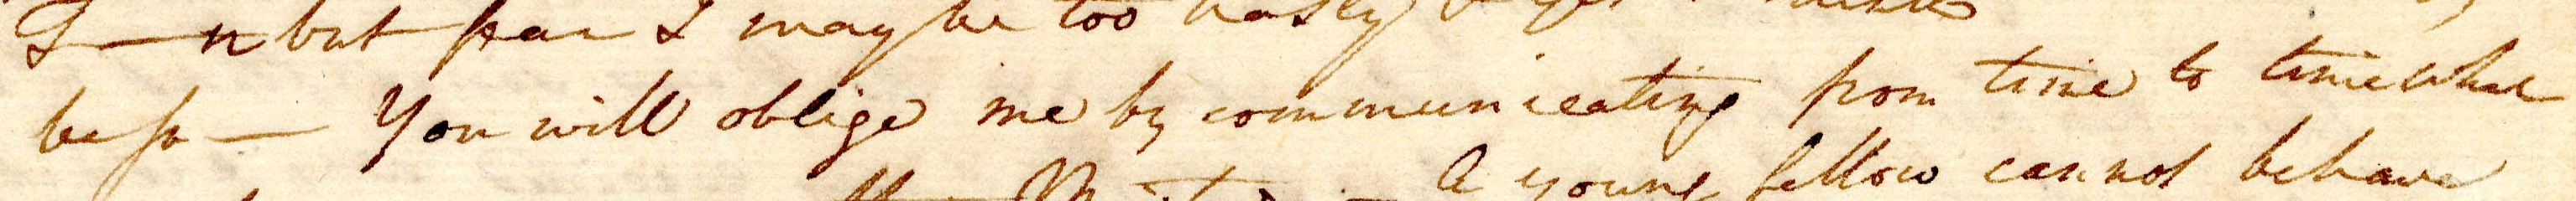be so. You will oblige me by communicating from time to time what
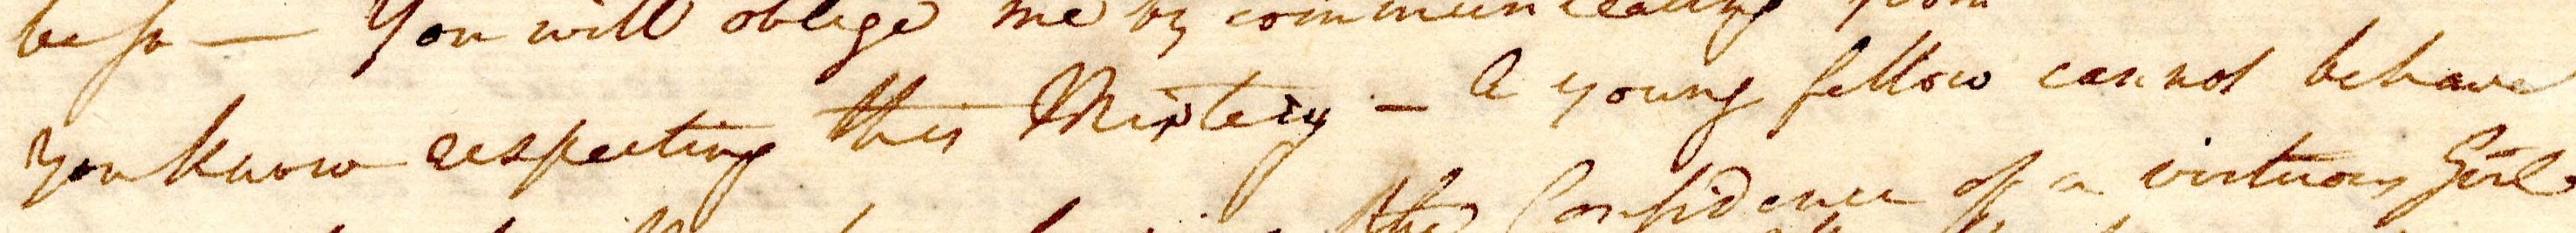you know respecting this Mistery. A young fellow cannot behave
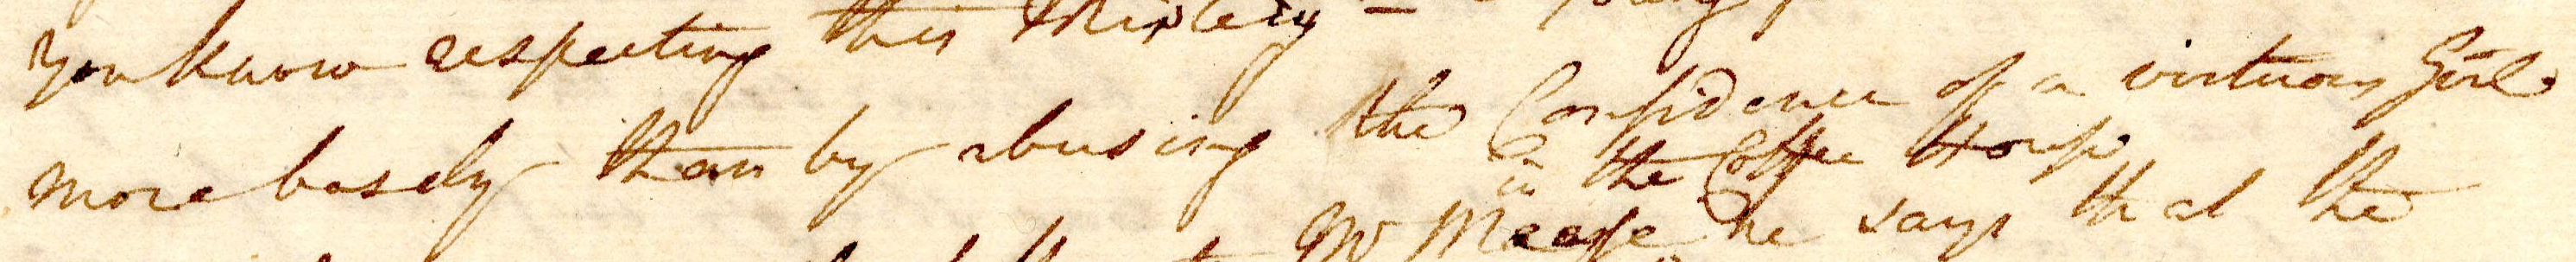more basely than by abusing the Confidence of a virtuous Girl
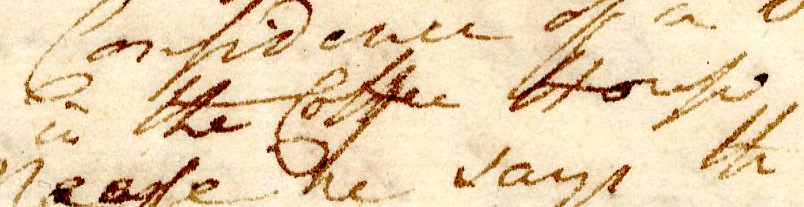in the Coffee House
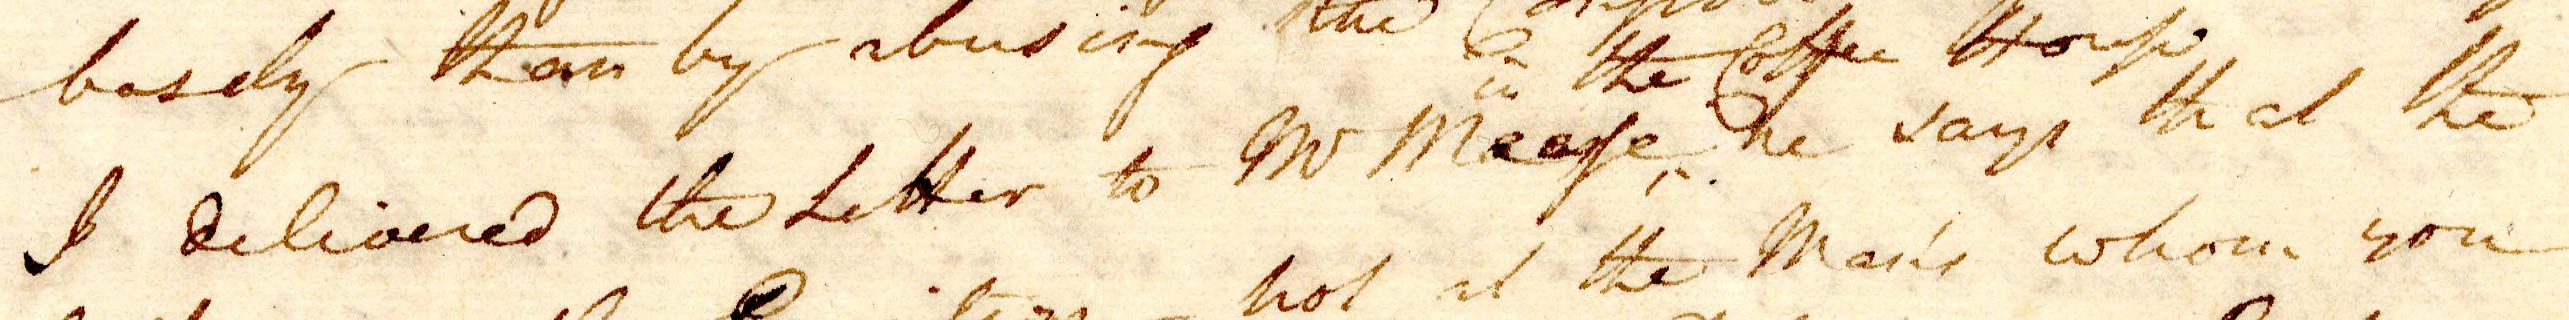I delivered the Letter to M^r Mease ^ he says that the
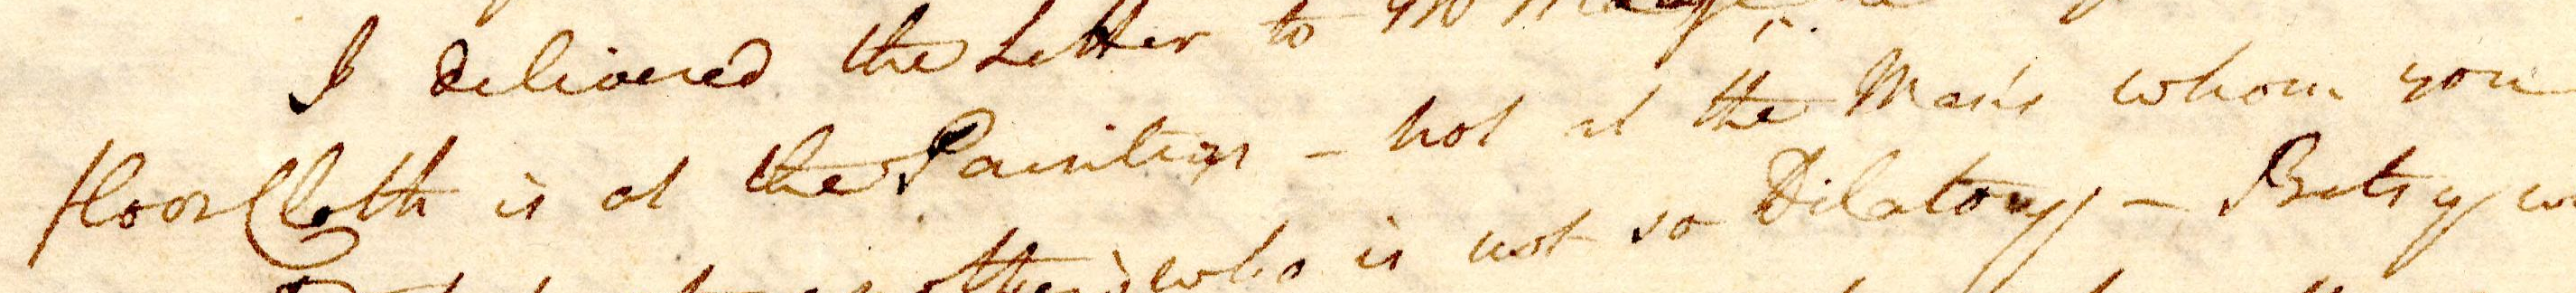floor Cloth is at the Painters- not at the Man's whom you
